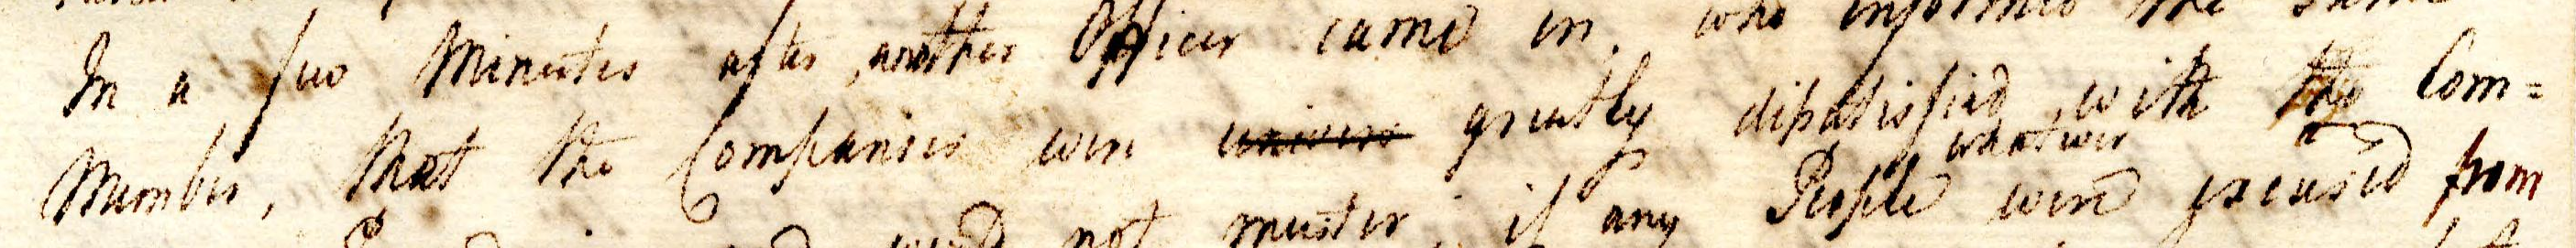Member, that the Companies were univers- greatly dissatisfied with the Com-
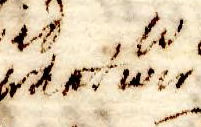whatever
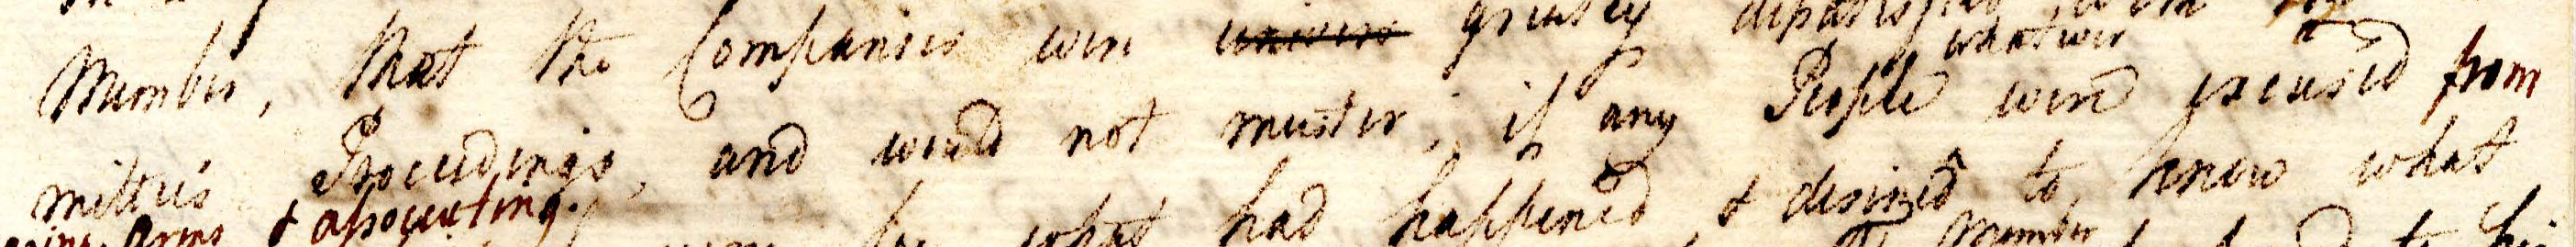-mittees Proceedings. and would not muster if any People ^ were excused from
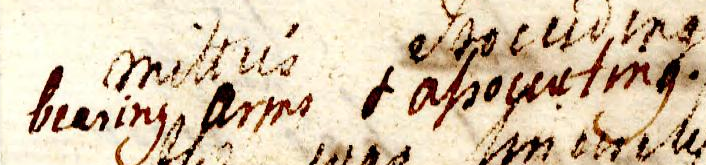bearing Arms & associating
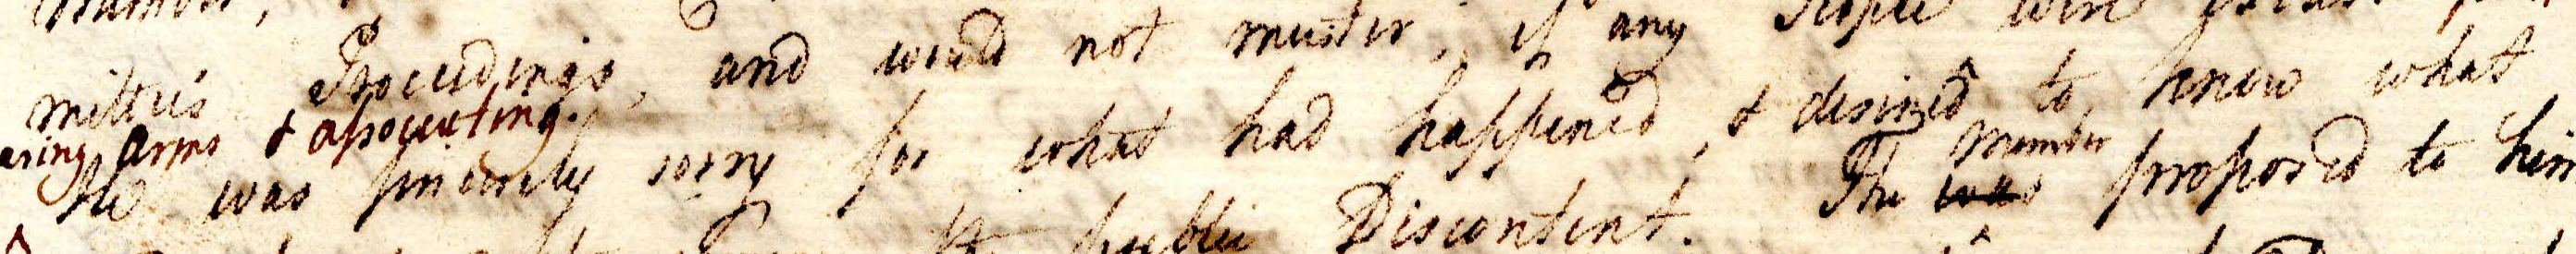^ He was sincerely sorry for what had happened & desired to know what
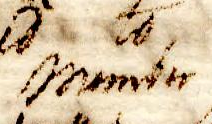Member
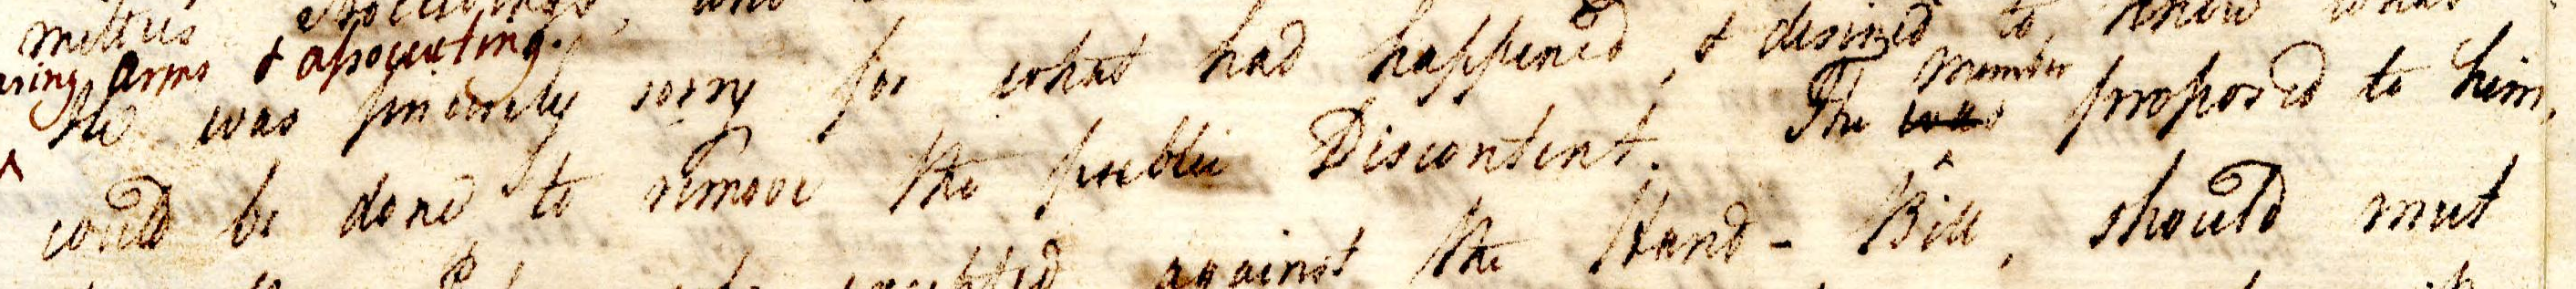could be done to remove the fembler Discontent .The [__]^ proposed to him
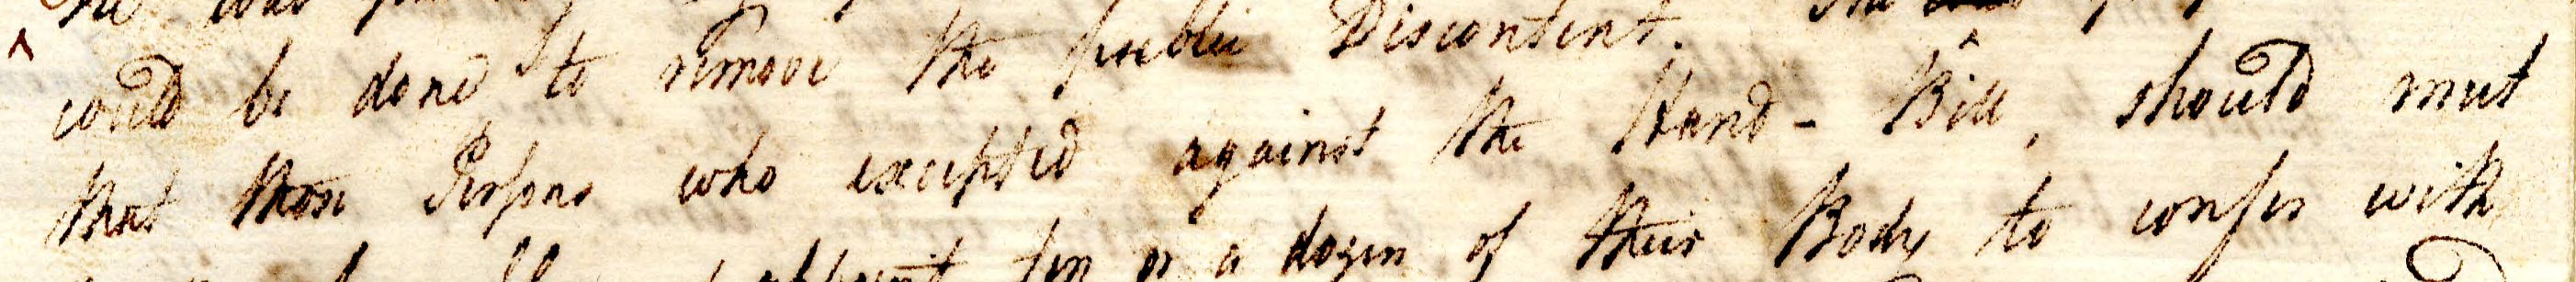that those Persons who excepted against the Hand-Bill, should meet
